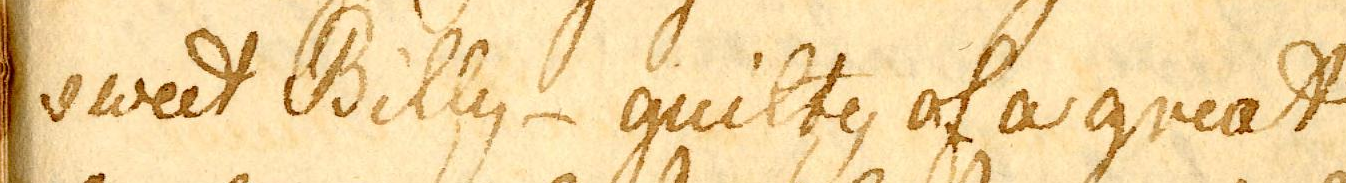sweet Billy- guilty of a great
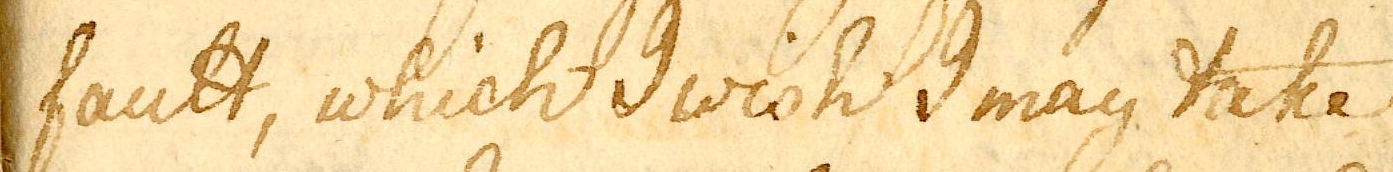fault, which I wish I may take
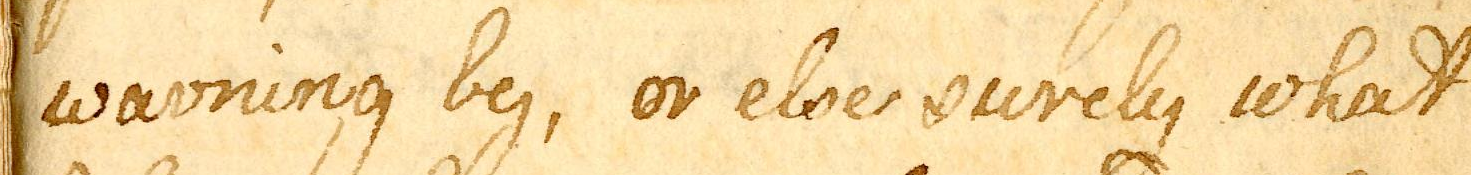warning by, or else surely what
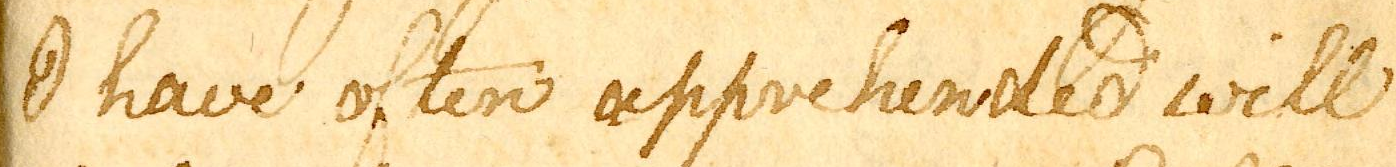I have often apprehended will
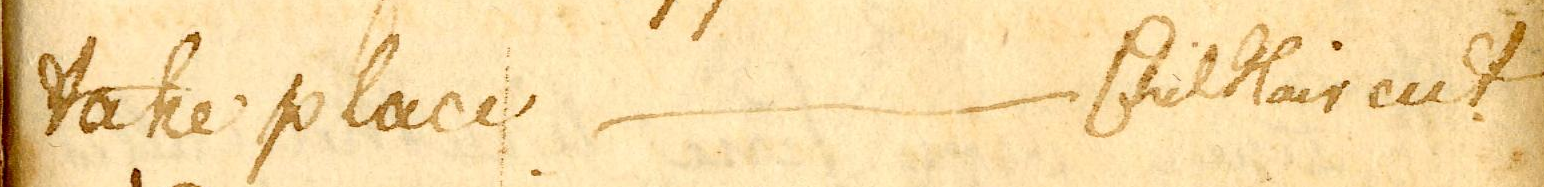take place- Chil Hair cut
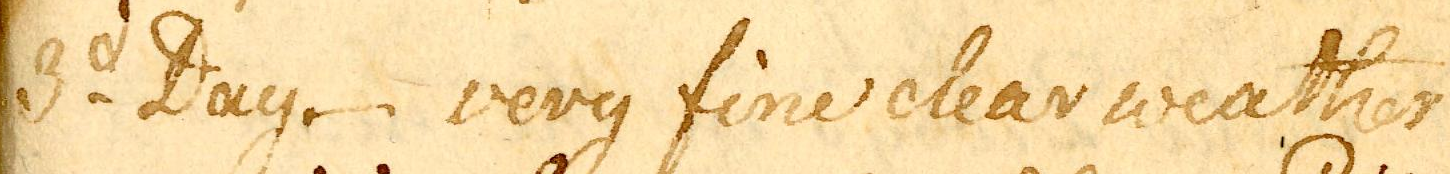3^d- Day- very fine clear weather
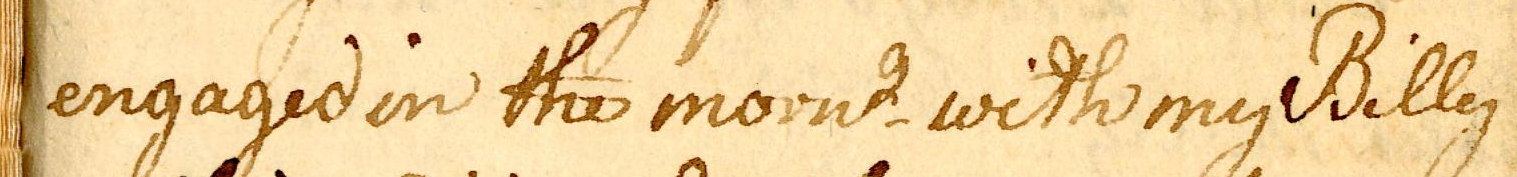engaged in the morn^g with my Billy
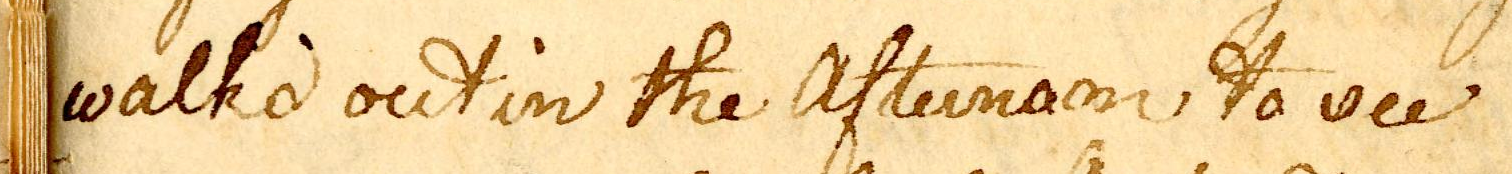walkd out in the Afternoon to see
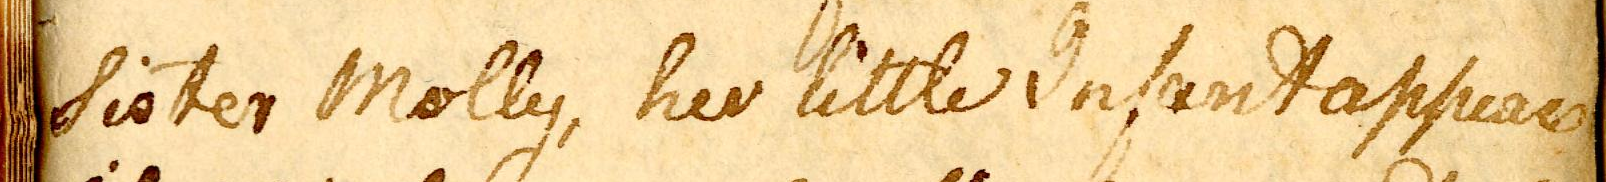Sister Molly, her little Infant appears
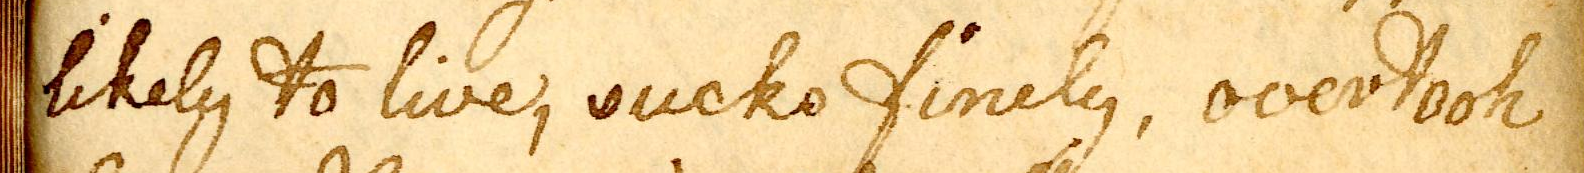likely to live, sucks finely, overtook
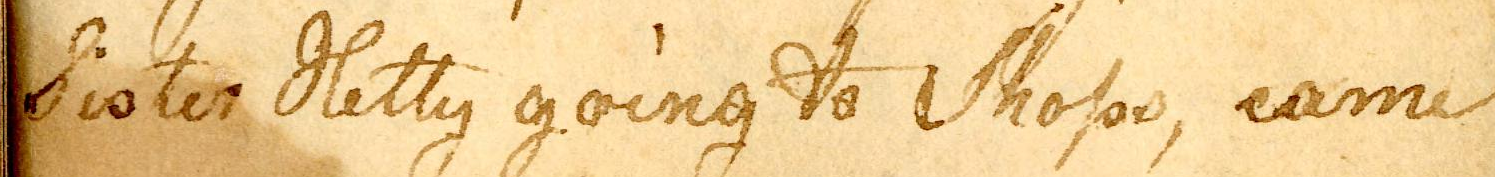Sister Hetty going to Shops, came
